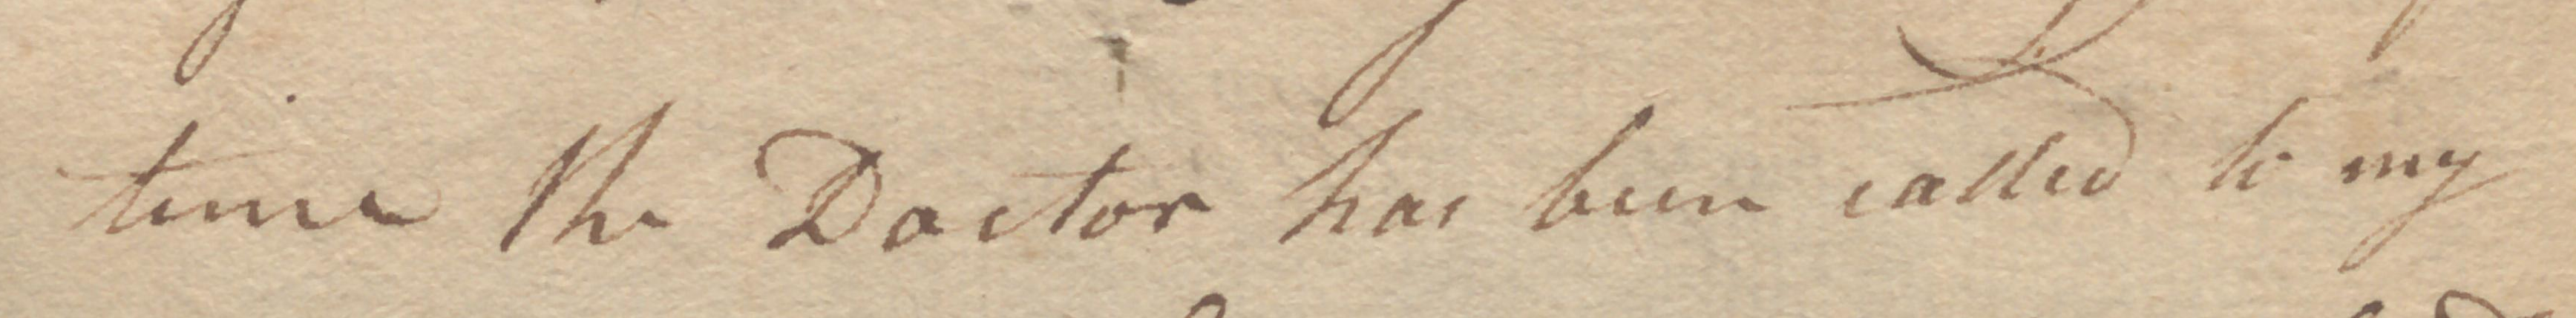time the Doctor has been called to my
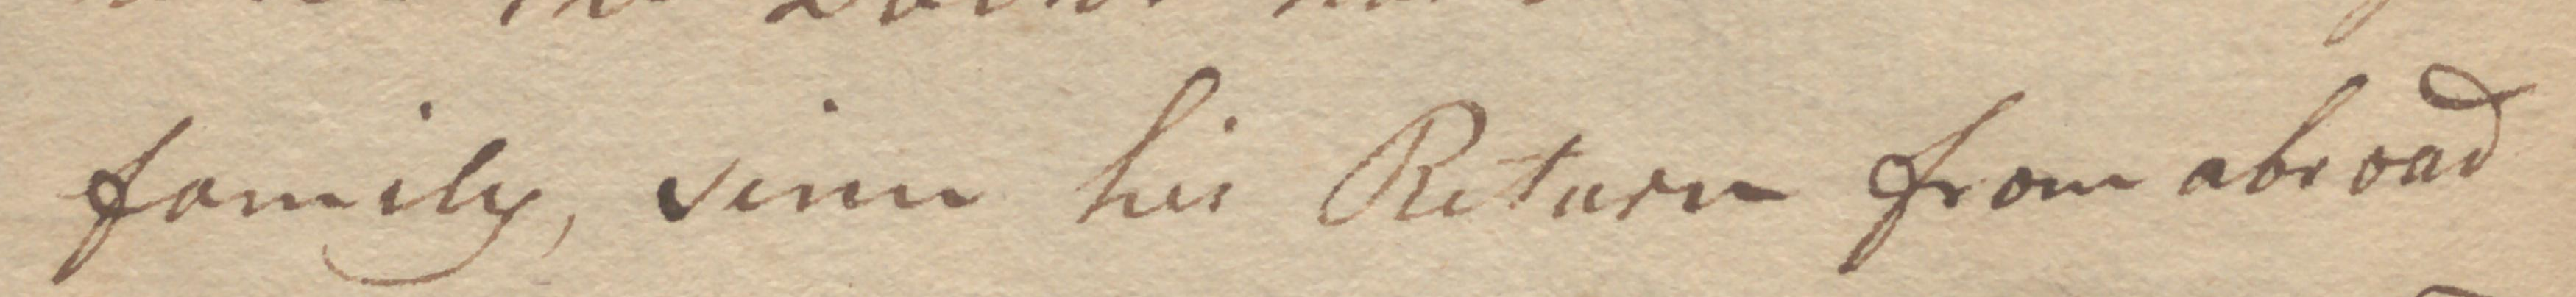family, since his Return from abroad
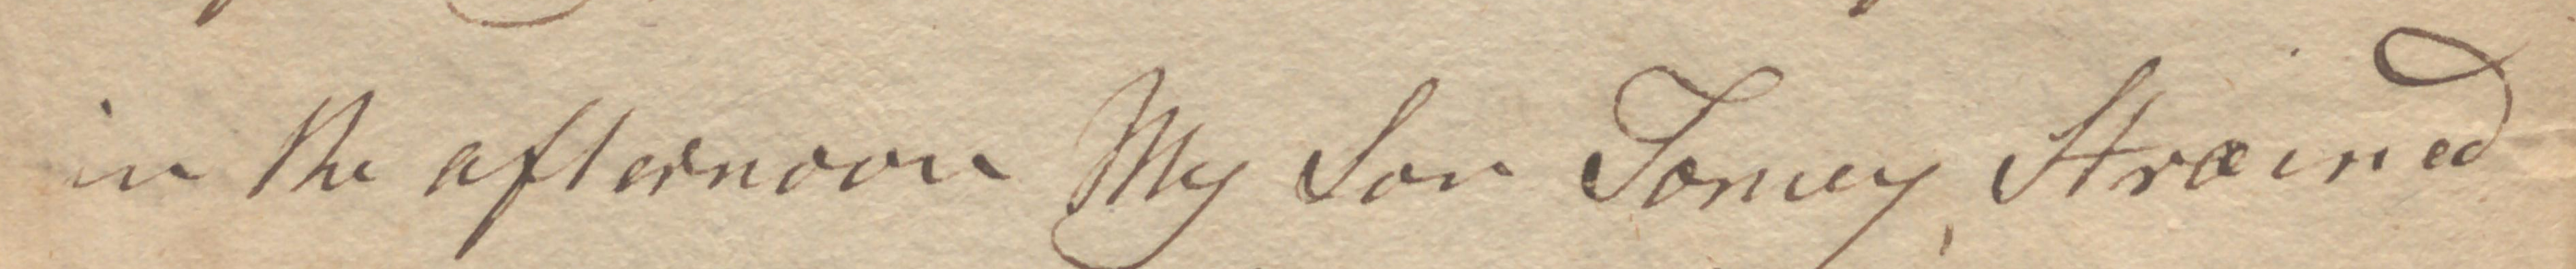in the afternoon My Son Tomey Strained
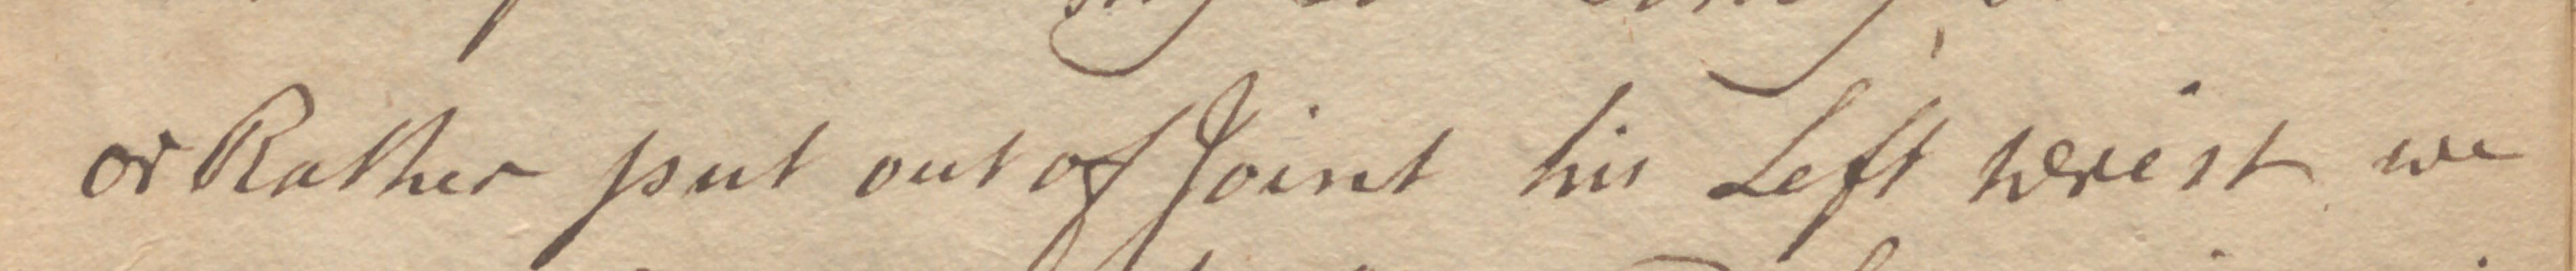or Rather put out of Joint his Left wrist we
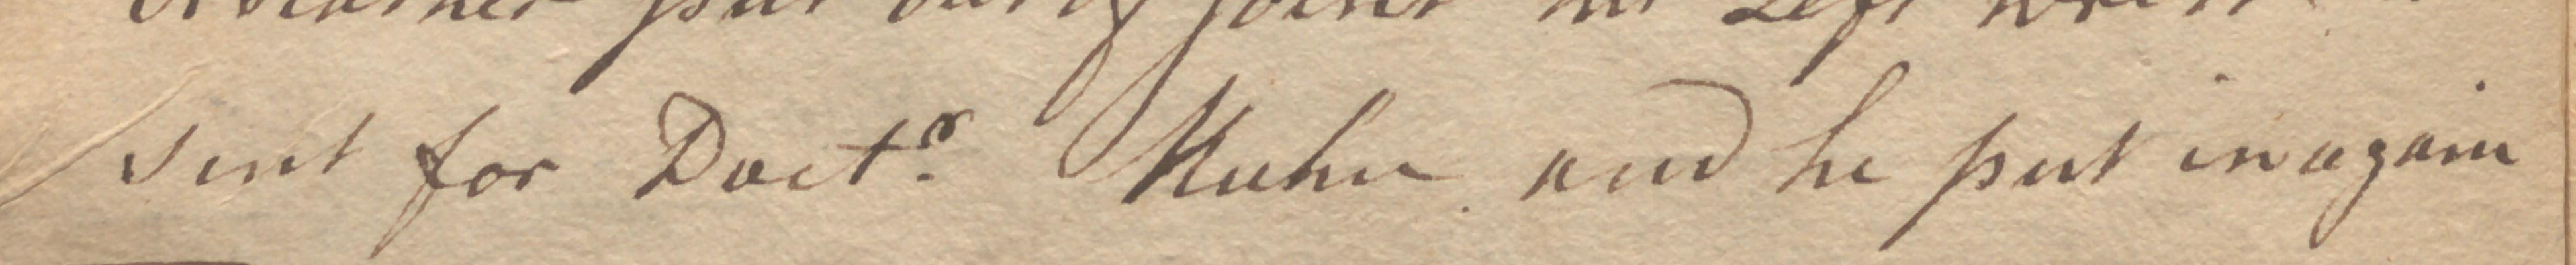sent for Doct^r. Kuhn and he put in again
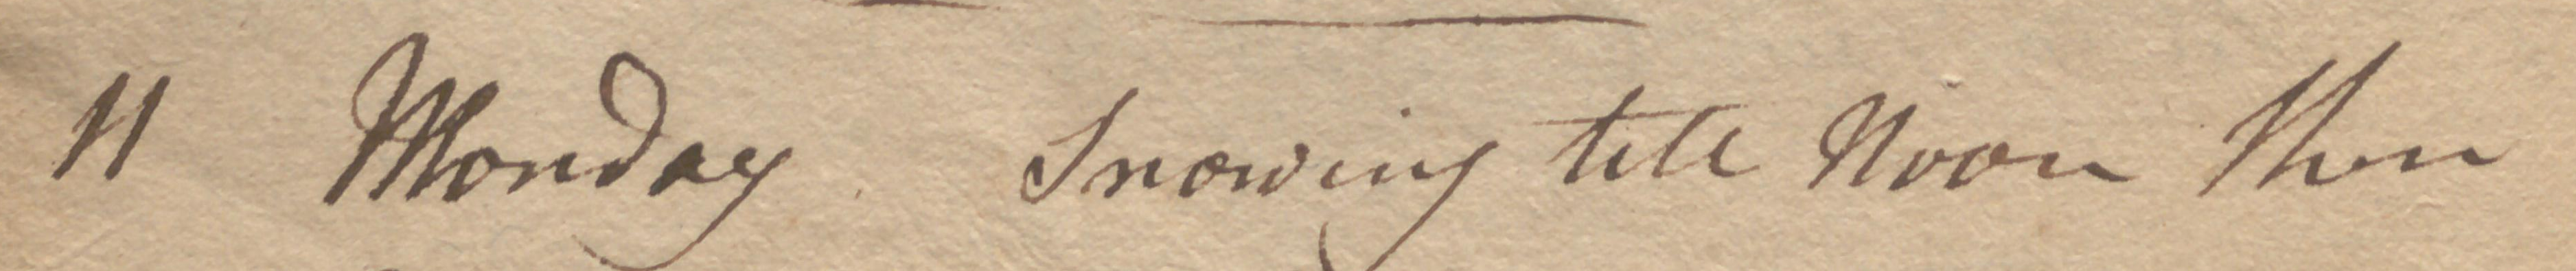11 Monday. Snowing till Noon then
